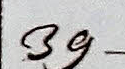39
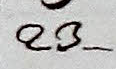23
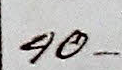40
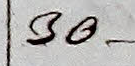30
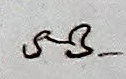53
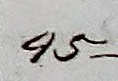45
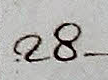28
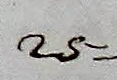25
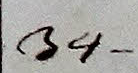34
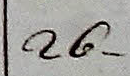26
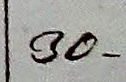30
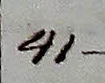41
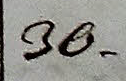30
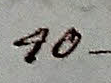40
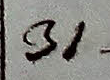31
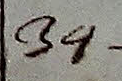34
